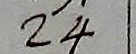24
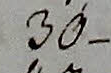30
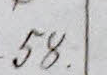58.
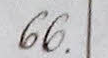66.
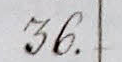36.
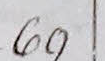69
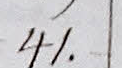41.
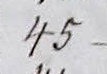45
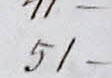51
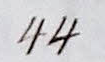44
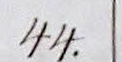44.
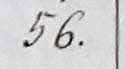56.
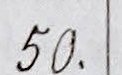50.
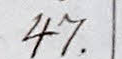47.
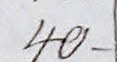40
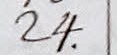24.
